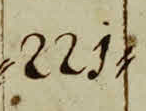221
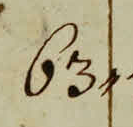63
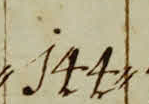144
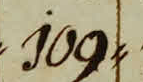109
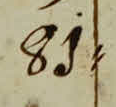81
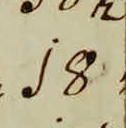18
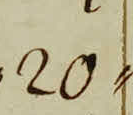20
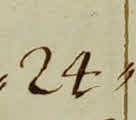24
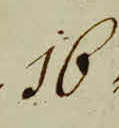16
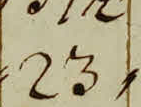23
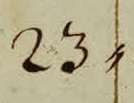23
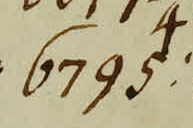6795
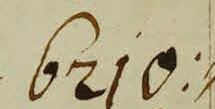6210
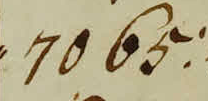7065
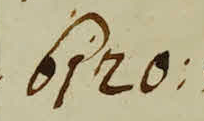6120
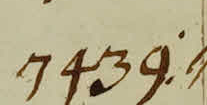7439
